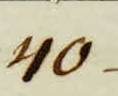40
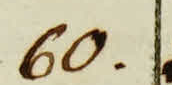60.
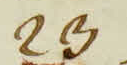23
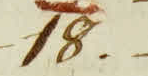18.
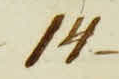14
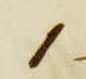1
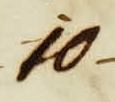10
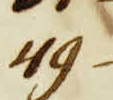49
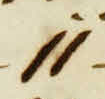11
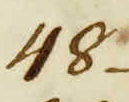48
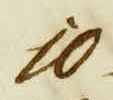10
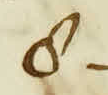8
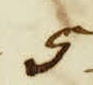5
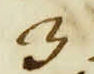3
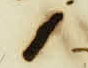1
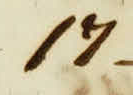17
